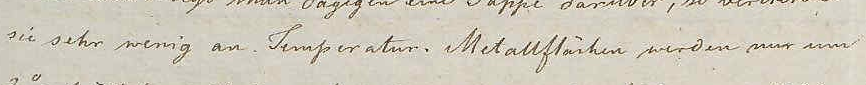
sie sehr wenig an Temperatur. Metallflächen werden nur um
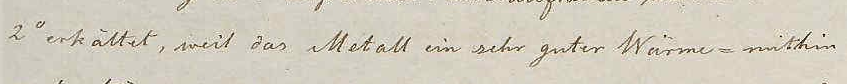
2° erkältet, weil das Metall ein sehr guter Wärme- mithin
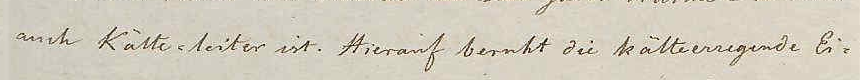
auch Kälte-leiter ist. Hierauf beruht die kälteerregende Ei-
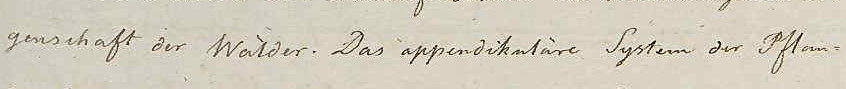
genschaft der Wälder. Das appendikuläre System der Pflan-
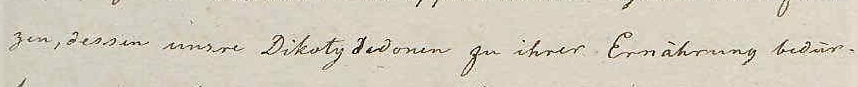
zen, dessen unsre Dikotydledonen zu ihrer Ernährung bedür-
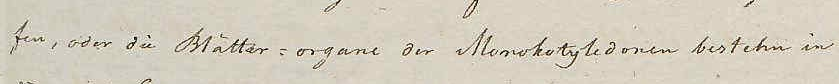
fen, oder die Blätter-organe der Monokotyledonen bestehn in
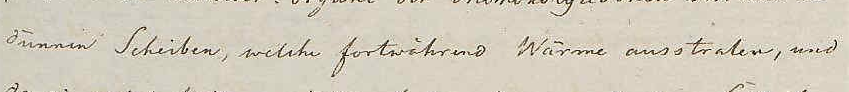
dünnen Scheiben, welche fortwährend Wärme ausstralen, und
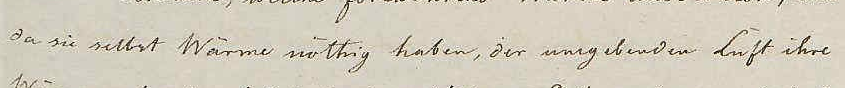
da sie selbst Wärme nöthig haben, der umgebenden Luft ihre
